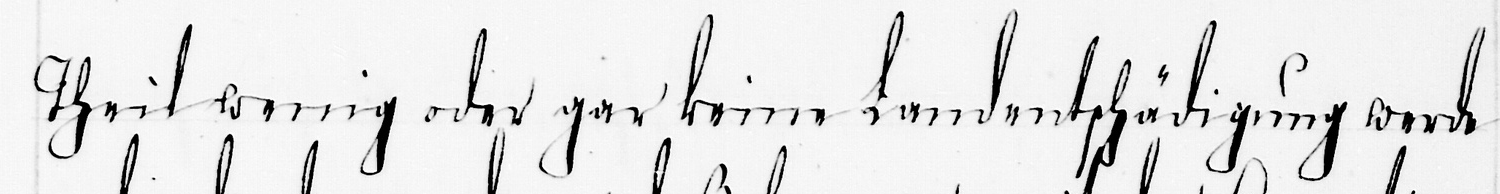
Theil wenig oder gar keine Landentschädigung werde
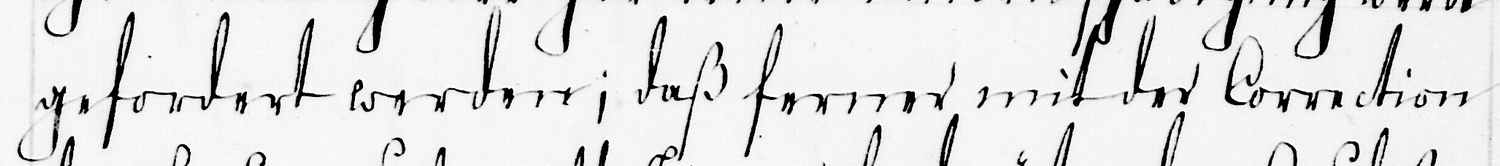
gefordert werden; daß ferner mit der Correction
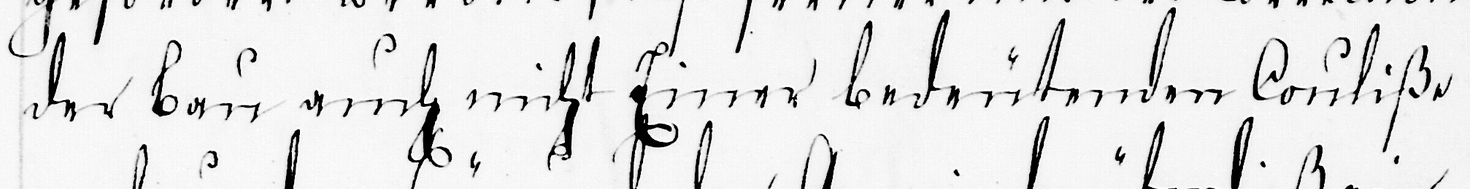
der Bau auch nicht Einer bedeutenden Couliße
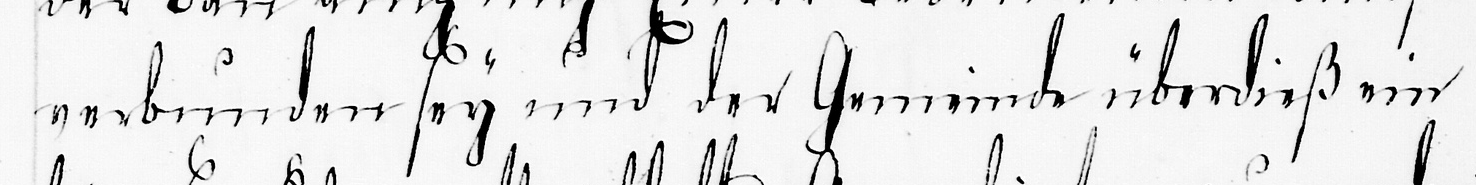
verbunden sey und der Gemeinde überdieß ein
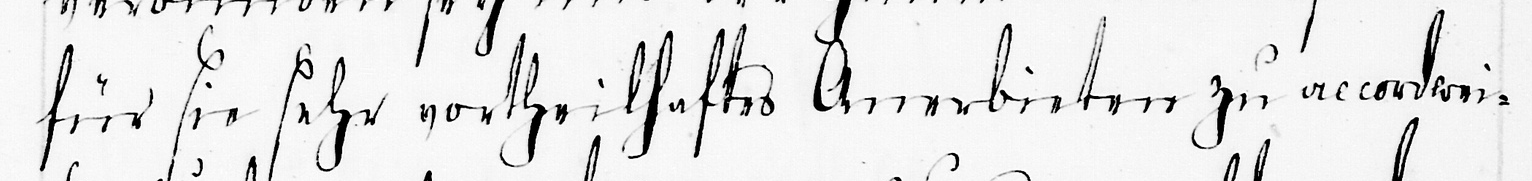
für sie sehr vortheilhaftes Anerbieten zu accordwei¬
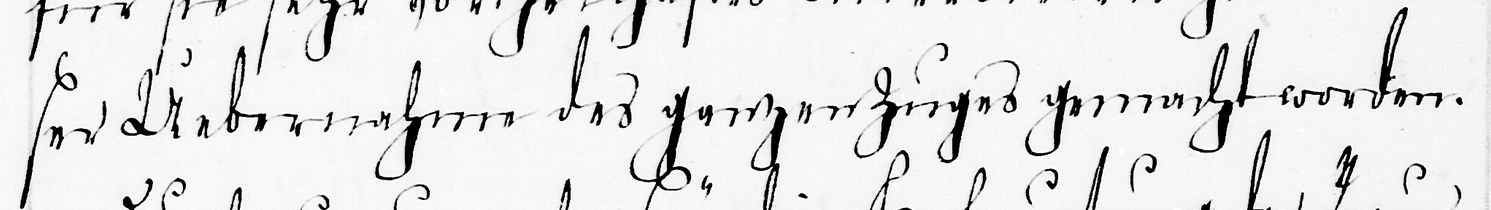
ser Uebernahme des ganzen Zuges gemacht worden.
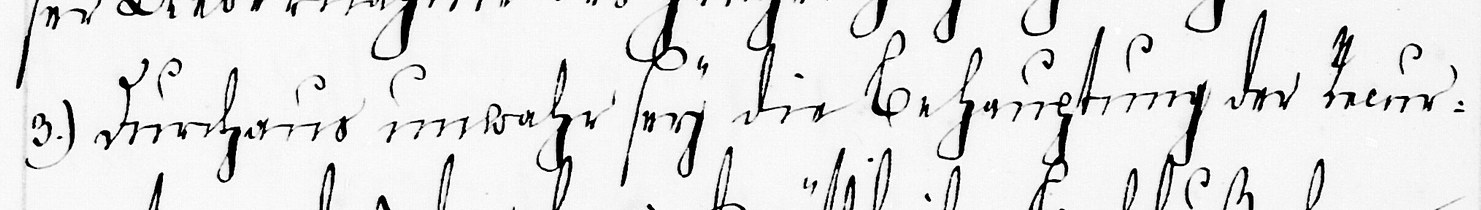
3.) Durchaus unwahr sey die Behauptung der Recur¬
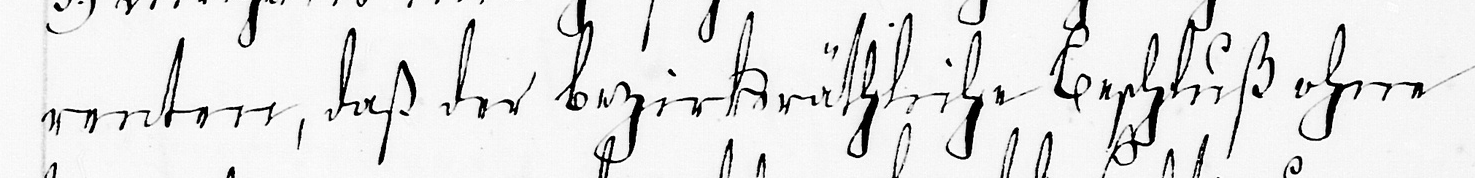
renten, daß der bezirksräthliche Beschluß ohne
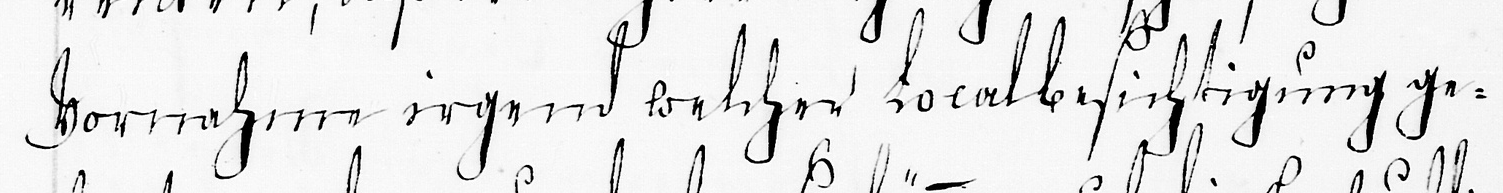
Vornahme irgend welcher Localbesichtigung ge¬
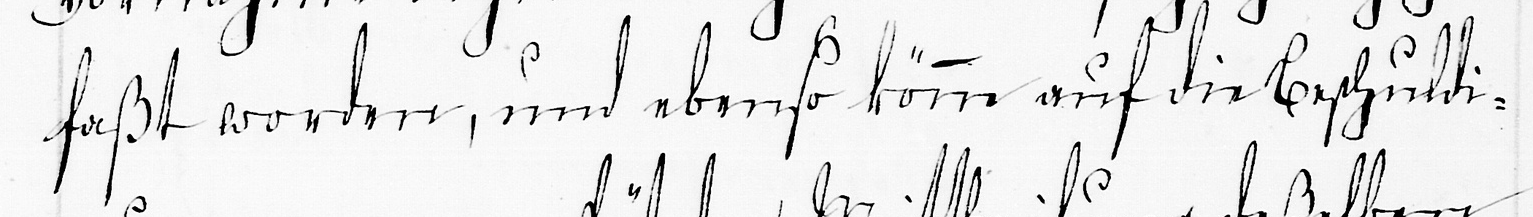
faßt worden, und ebenso könne auf die Beschuldi¬
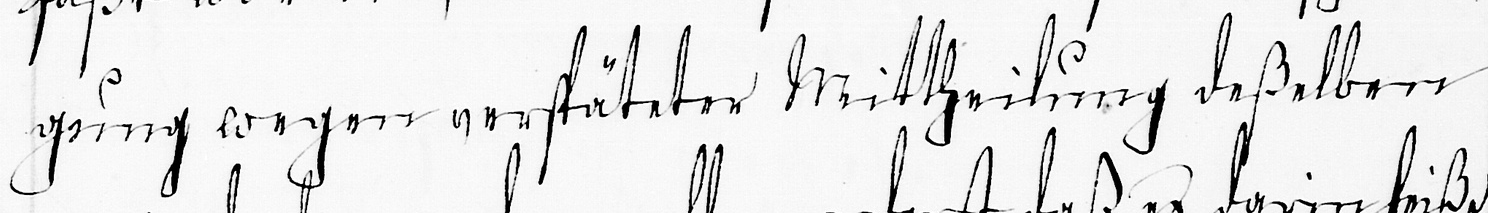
gung wegen verspäteter Mittheilung deßelben
